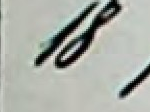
18
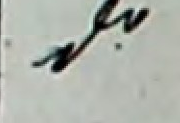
do
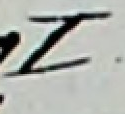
I
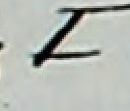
I
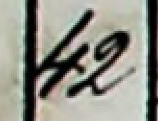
42
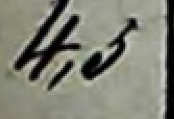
4,5
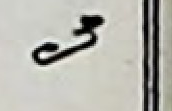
3
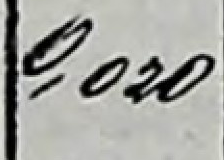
0,020
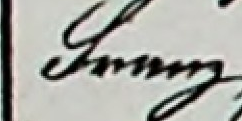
Franz
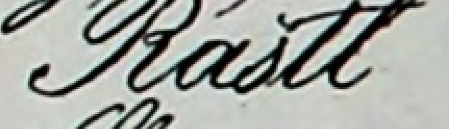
Rastl
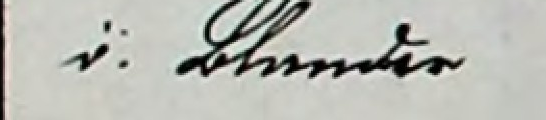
v. Blander
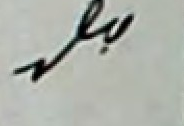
do
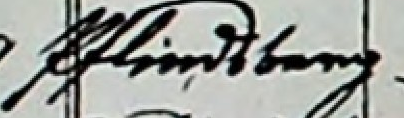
Pflindsberg
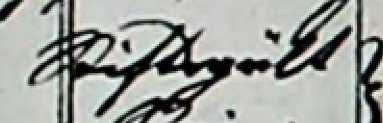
Stiftsgült
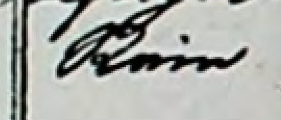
Rein
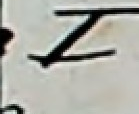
I
